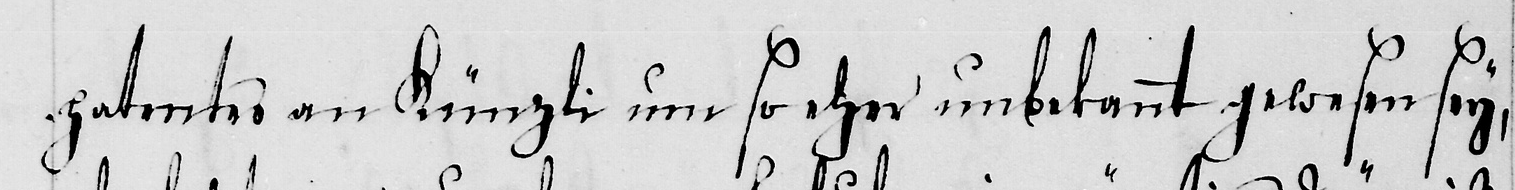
patentes an Künzli umso eher unbekannte gewesen sey,
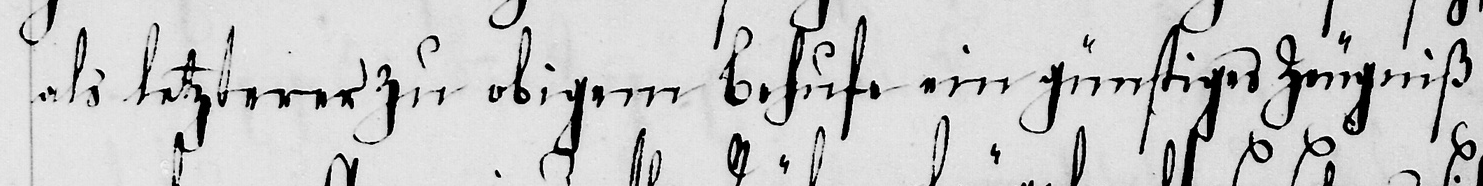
als letzterer zu obigem Behufe ein günstiges Zeugniß
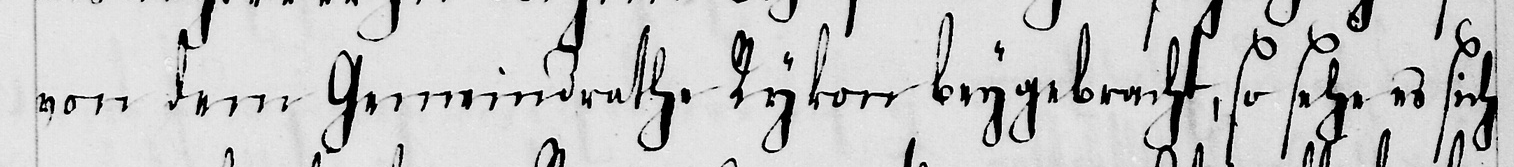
von dem Gemeindrathe Rykon beygebracht, so sehe es sich
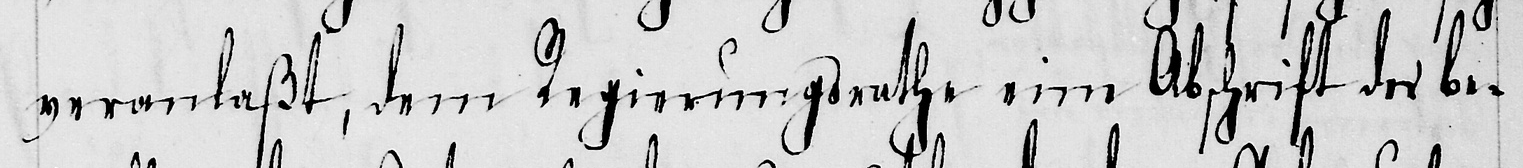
veranlaßt, dem Regierungsrathe eine Abschrift der be¬
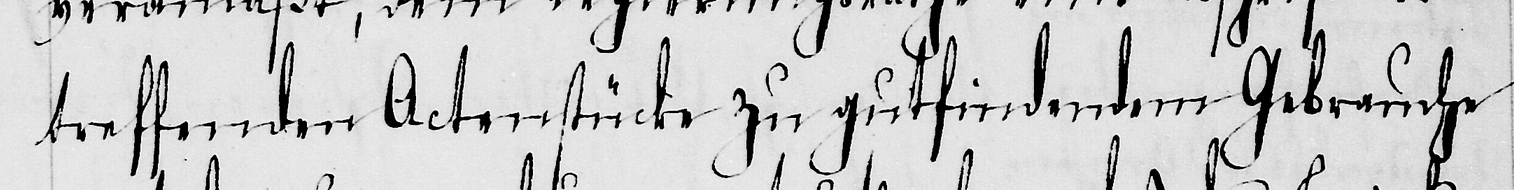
treffenden Actenstücke zu gutfindendem Gebrauche
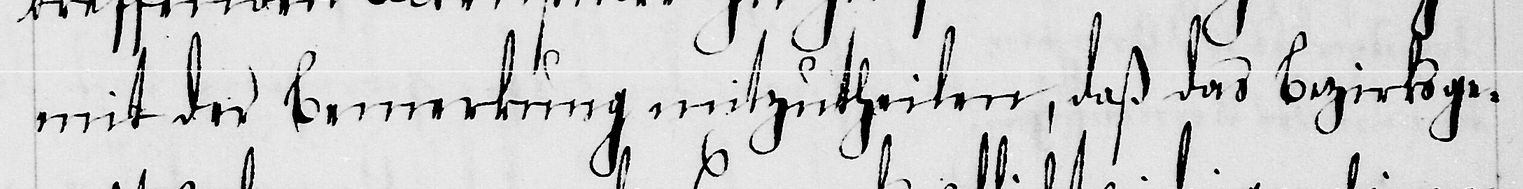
mit der Bemerkung mitzutheilen, daß das Bezirksge¬
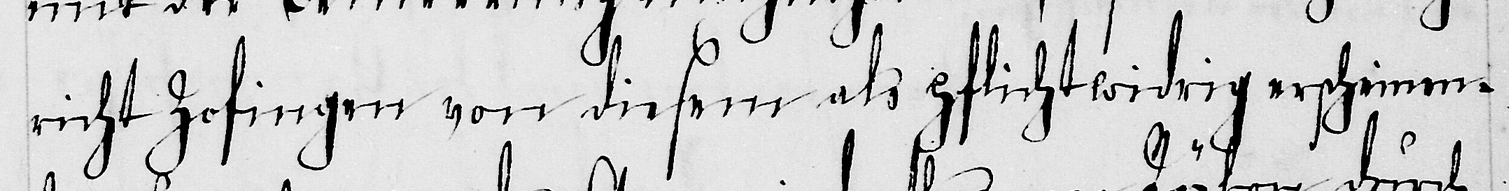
richt Zofingen von diesem als pflichtwidrig erscheinen¬
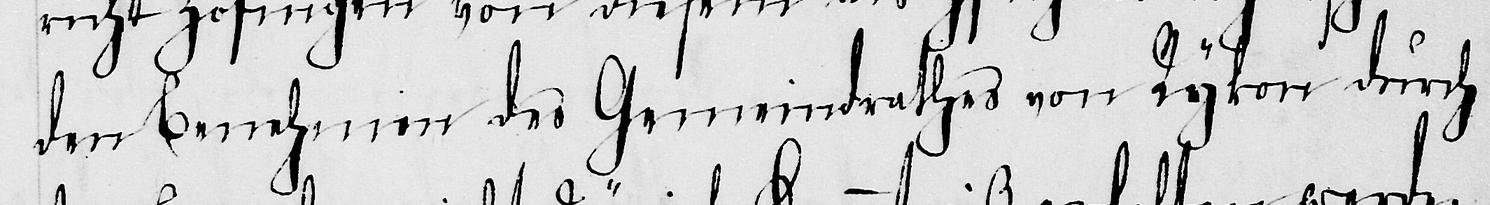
den Benehmen des Gemeindrathes von Rykon durch
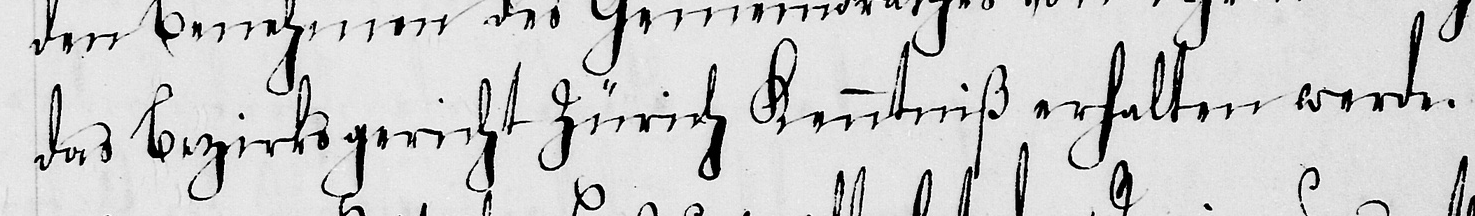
das Bezirksgericht Zürich Kenntniß erhalten werde.
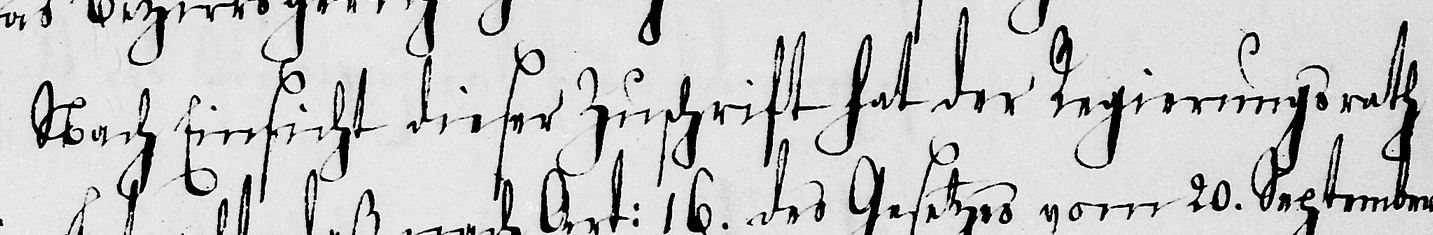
Nach Einsicht dieser Zuschrift hat der Regierungsrath
